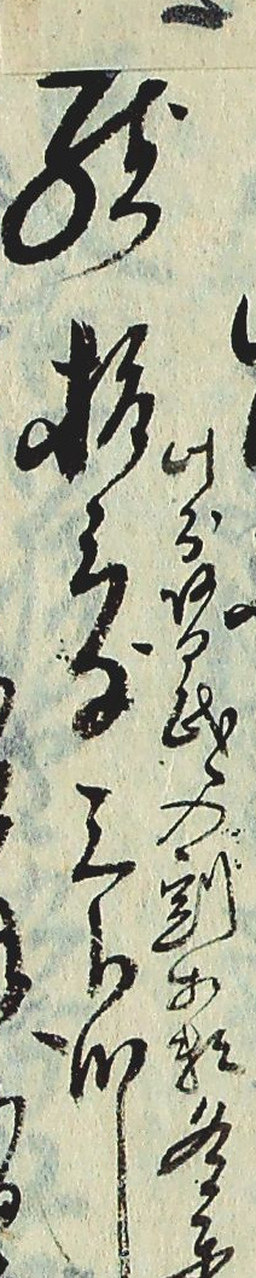残拾三匁三分弐厘
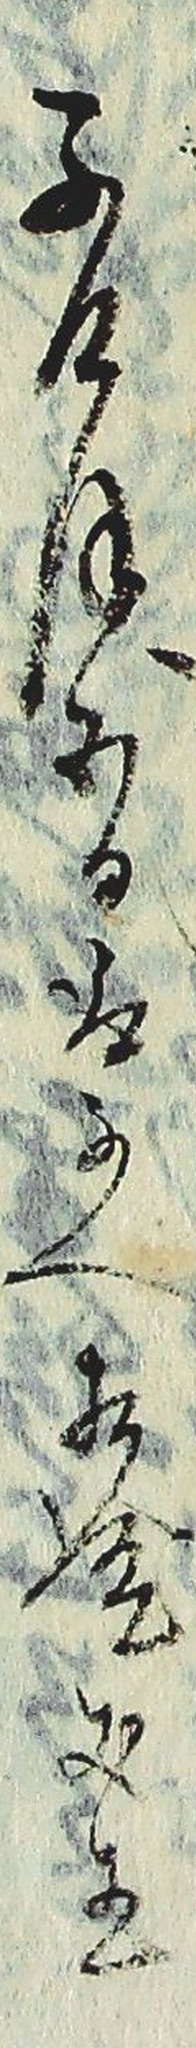子四月五日取かへ相渡使直

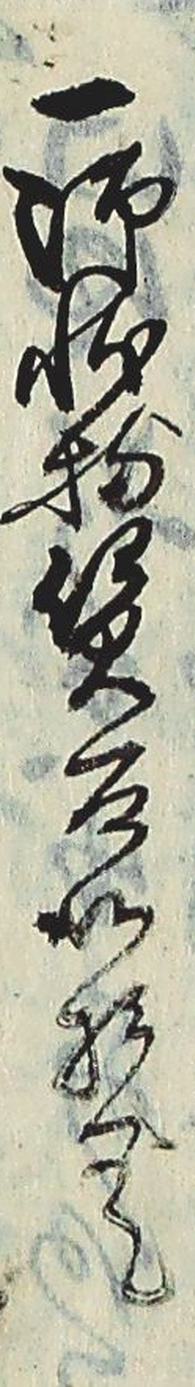一御状持賃百弍拾匁
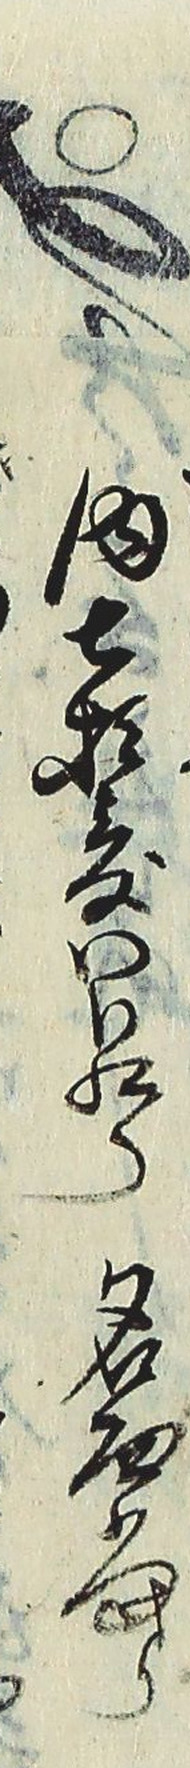内七拾三匁八分九厘名西当り
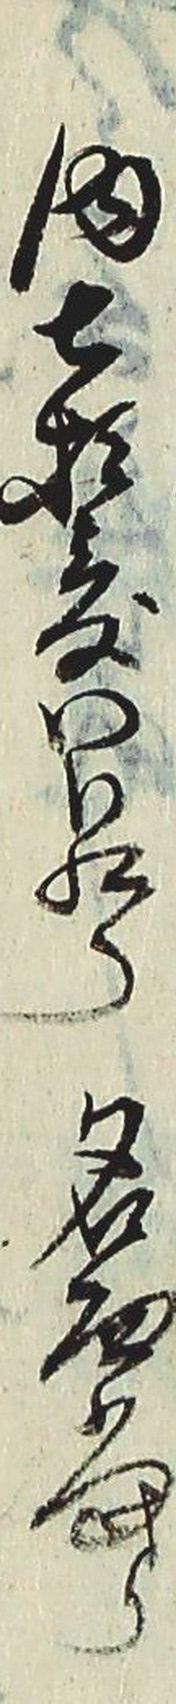内七拾三匁八分九厘名西当り
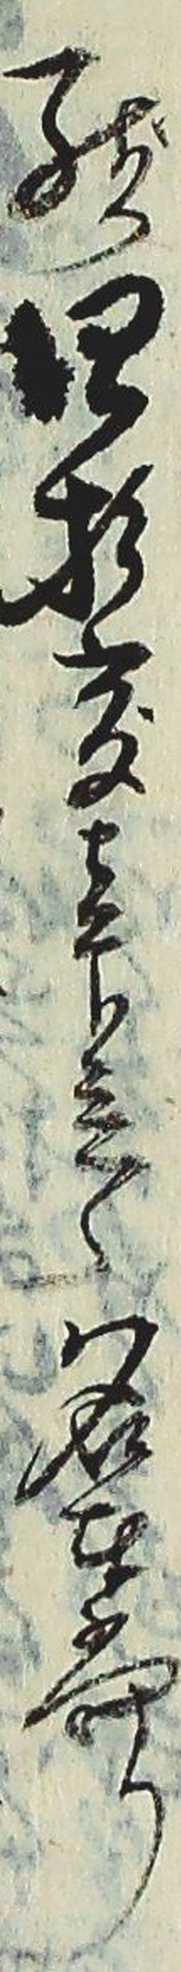残り四拾六匁壱分壱厘名東当り
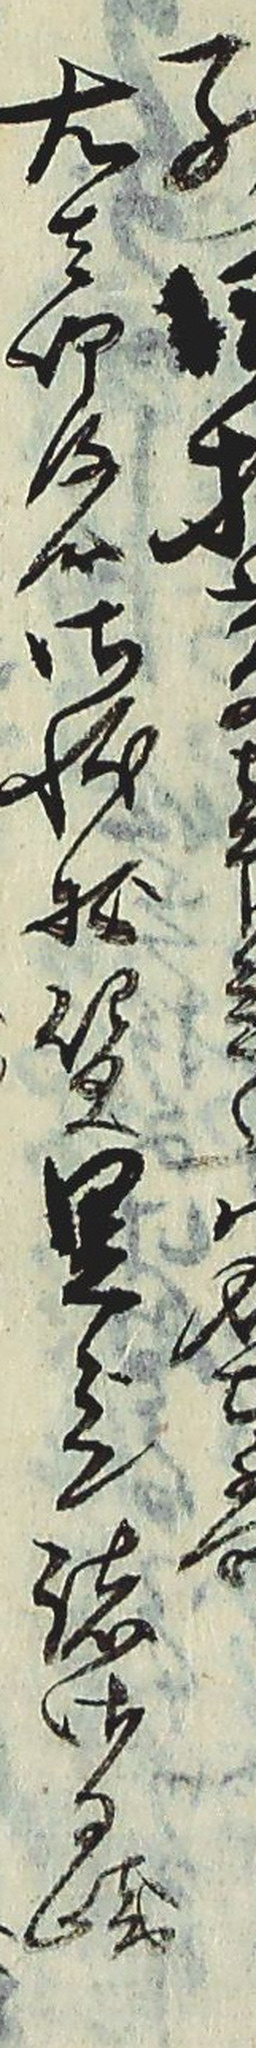右は御役所御状持賃是迄諸御手崎
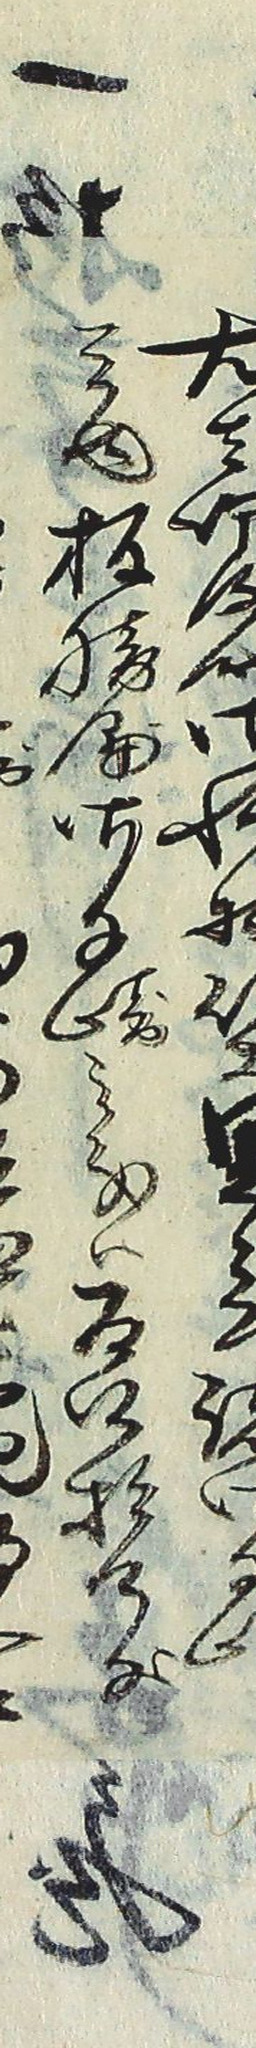之内板勝浦御手崎之義は百四拾四匁
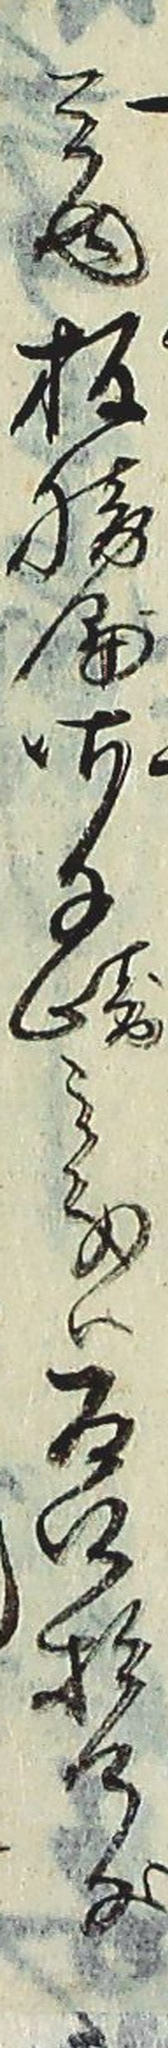之内板勝浦御手崎之義は百四拾四匁
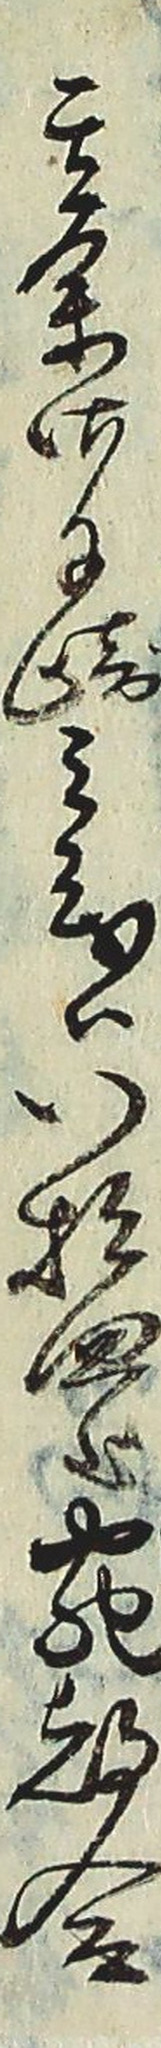其余御手崎之義は八拾四匁宛都合
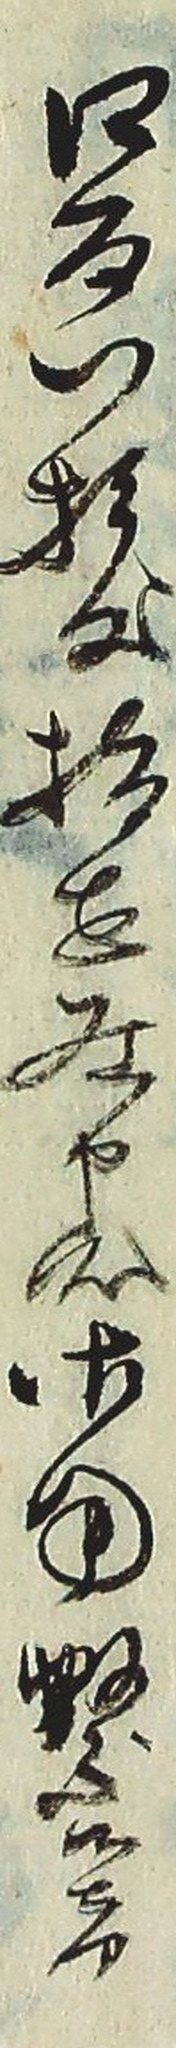四百八拾匁指出居申所御用繁候節
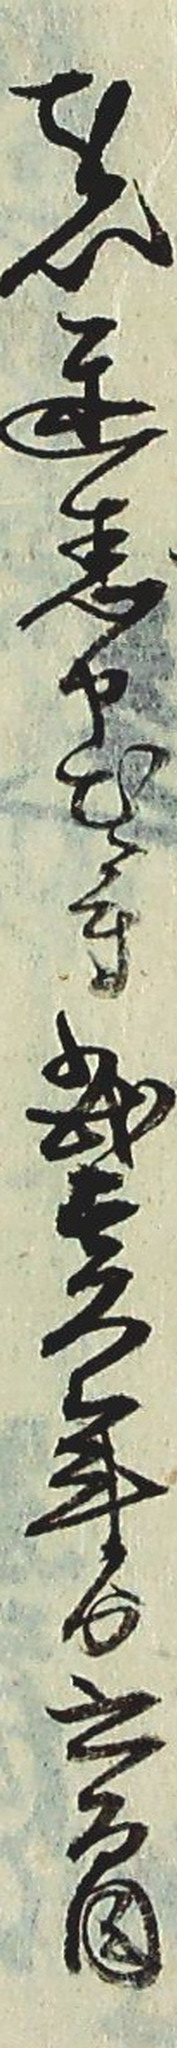を以迷惑申出候付当亥年ゟ六百目
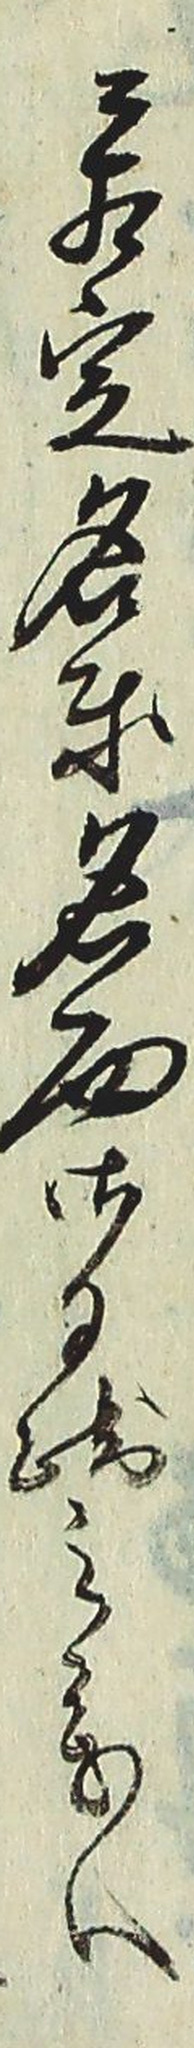可相定名東名西御手崎之義は
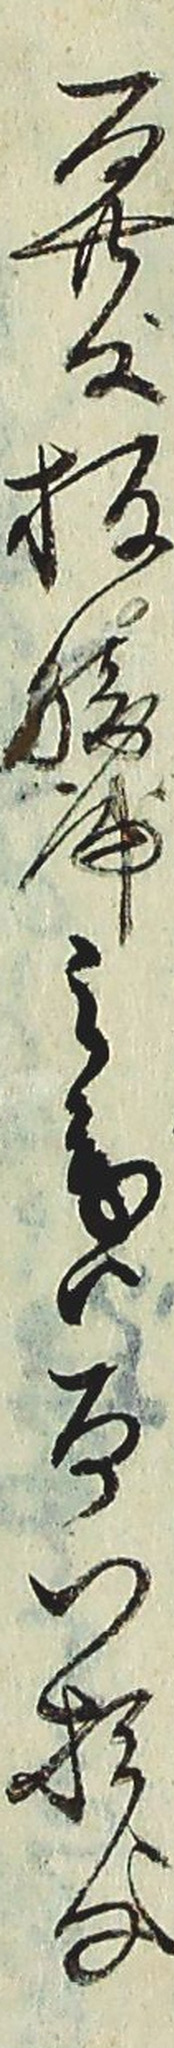百廿匁板勝浦之義は百八拾匁
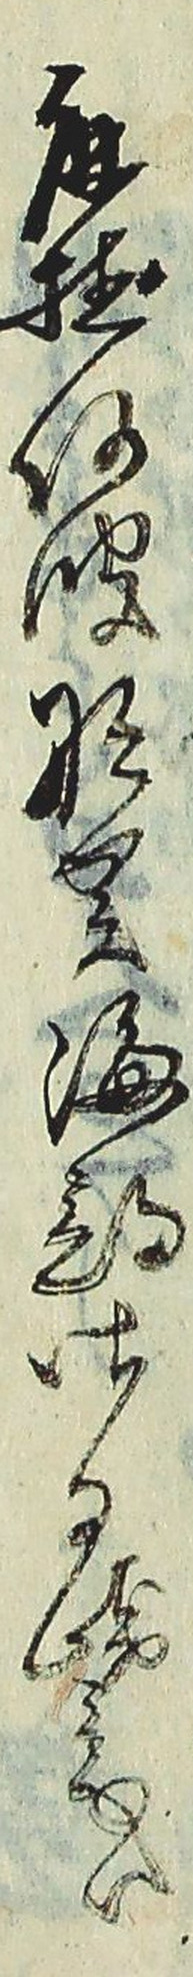麻植阿波那賀海部御手崎之義は
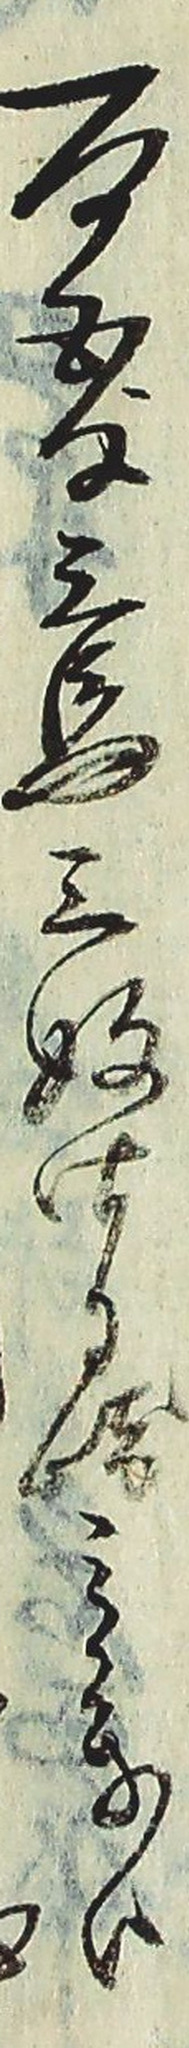百五匁三馬三好御手崎之義は
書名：名東郡中諸割賦元帳
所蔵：鳴門教育大学 Naruto University of Education
